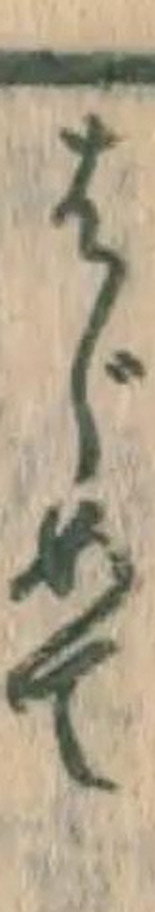はじめて
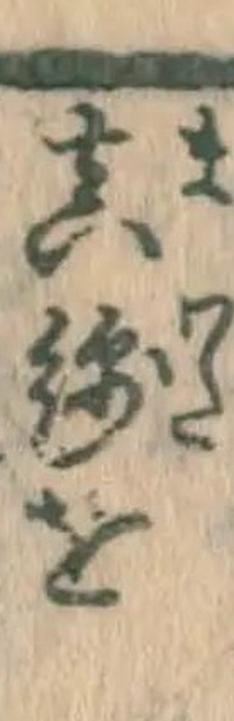真綿を
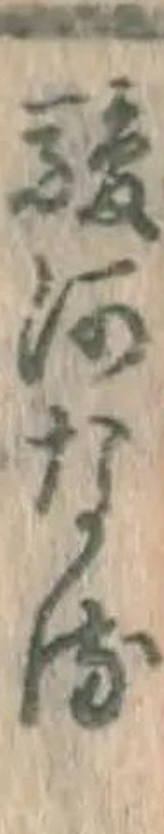駿河なる
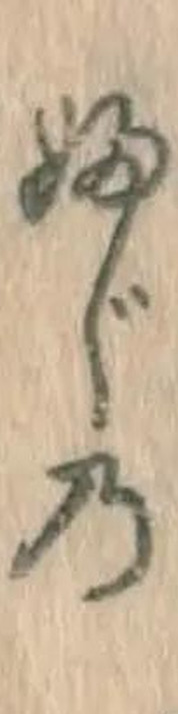ふじの
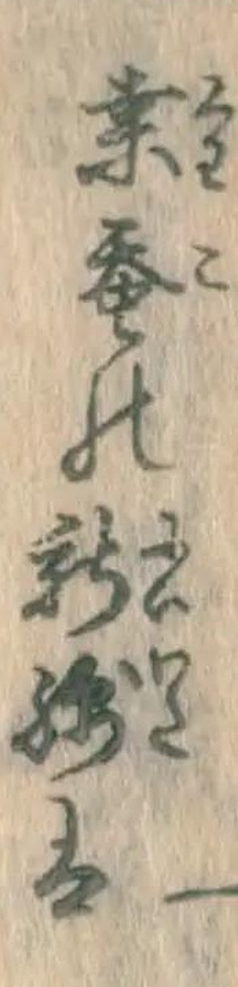桑蚕の新綿は
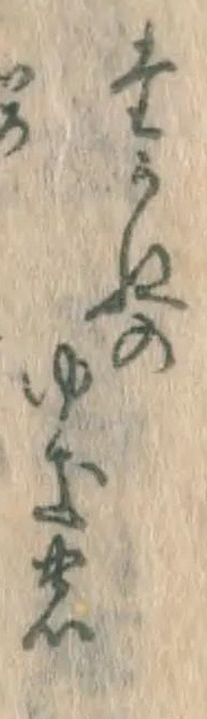たかねのゆきの
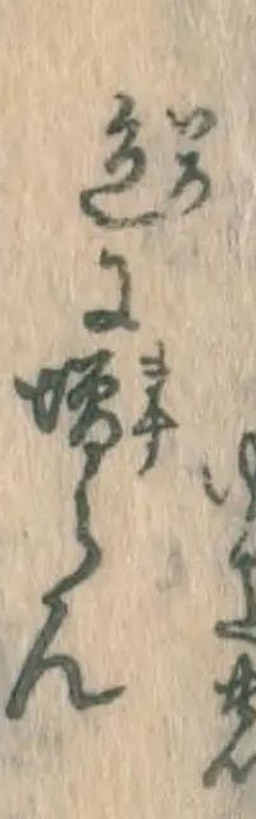色に増らん

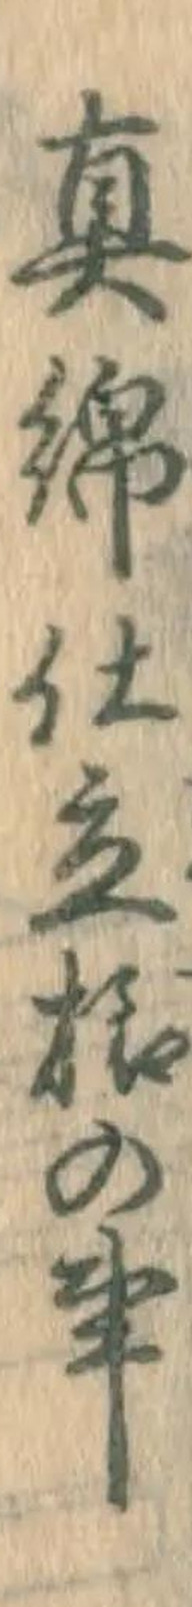真綿仕立様の事
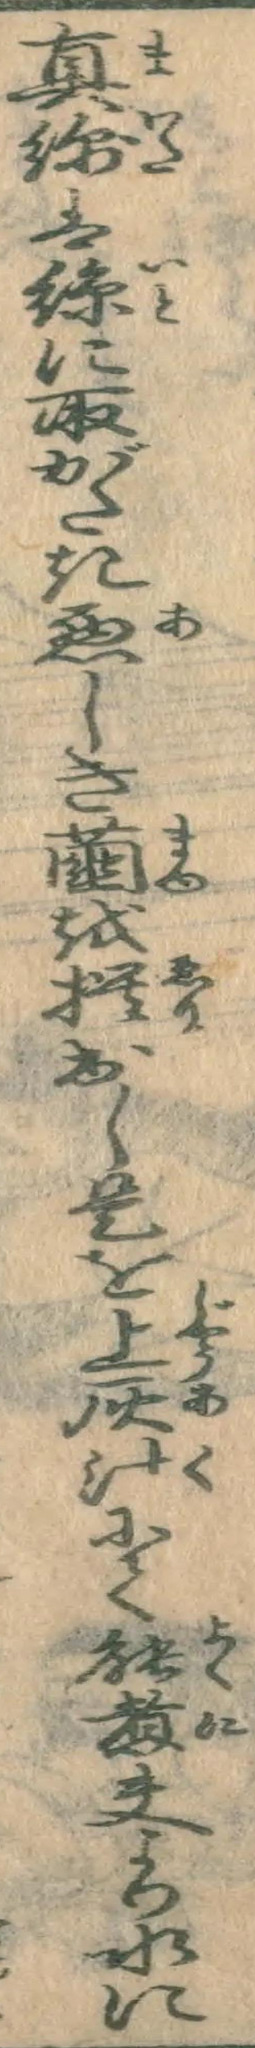真綿は糸に取がたき悪しき繭を撰出し是を上灰汁にて能煮夫より水に
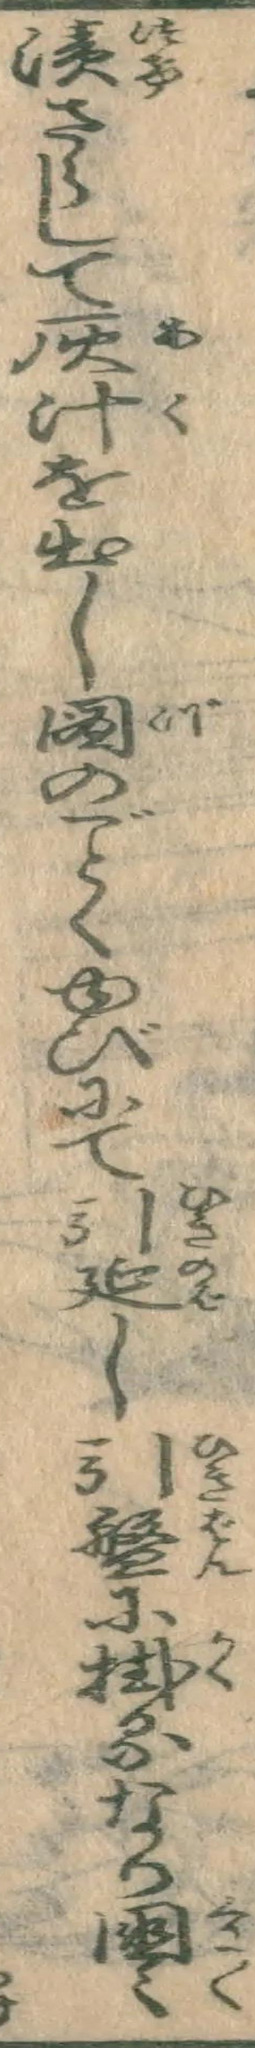漬さらして灰汁を出し図のごとくゆびにて引延し引盤に掛るなり国々
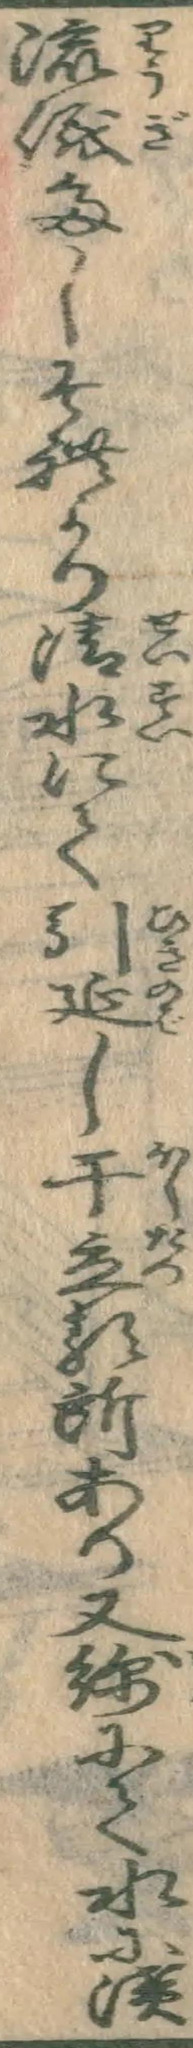流儀多しそれより清水にて引延し干立る所あり又綿にて水に潰
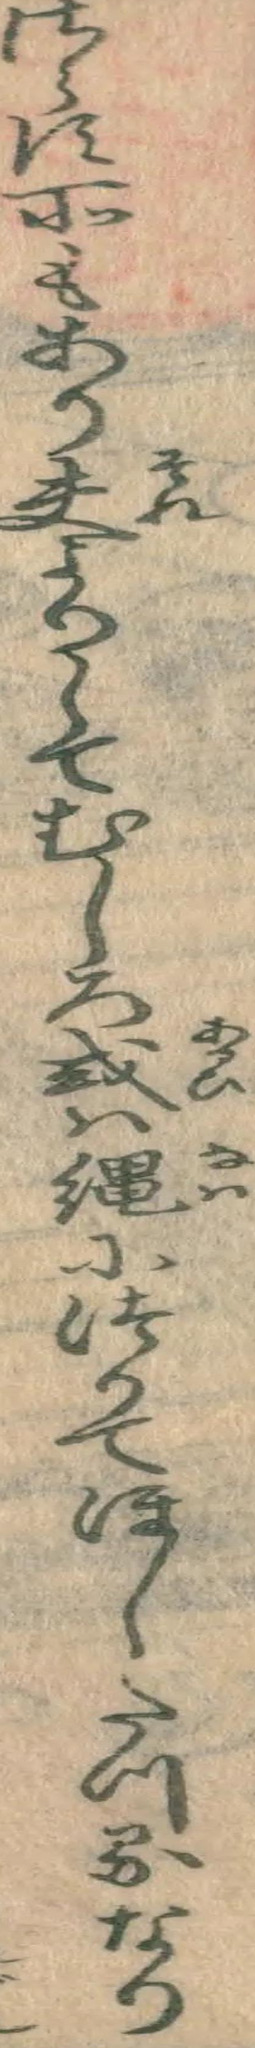さらす所もあり夫よりしてむしろ或は繩につりてほしたつるなり
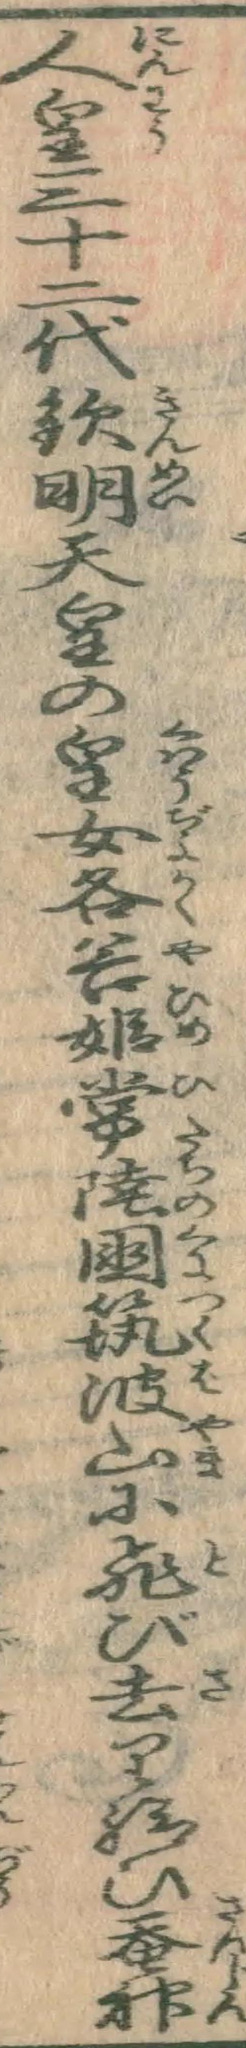人皇三十二代欽明天皇の皇女各谷姫常陸國筑波山に飛び去り給ひ蚕神
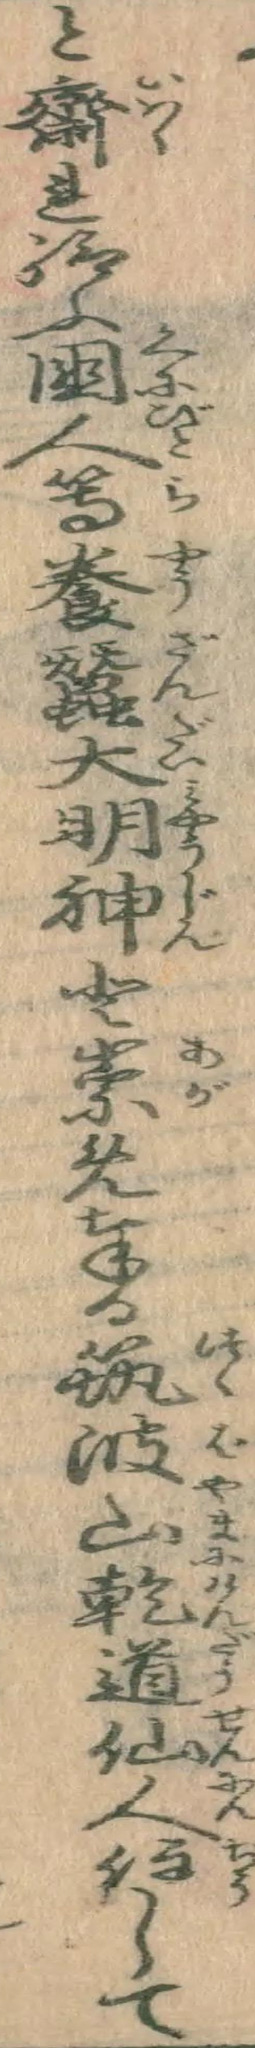と斎れ給ふ国人等養蚕大明神と崇め奉る筑波山乾道仙人住して
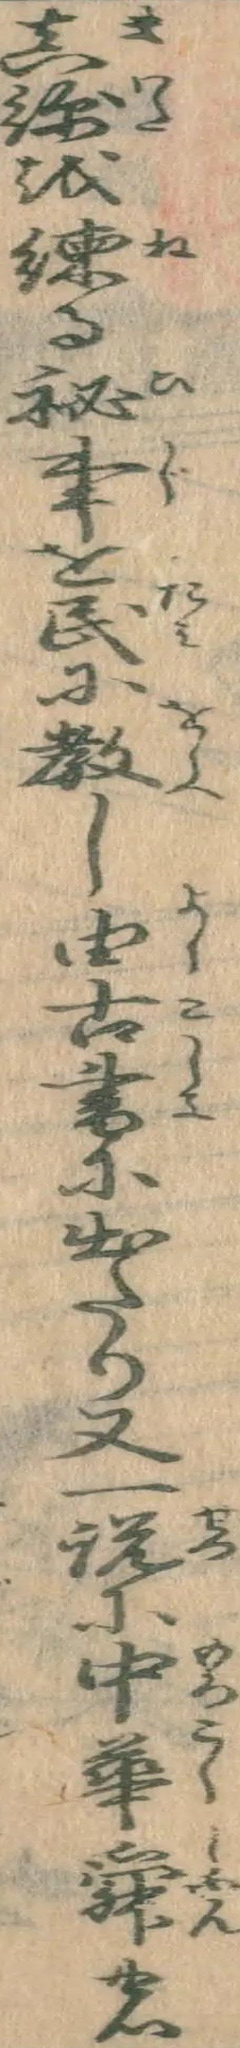真綿を練る秘事を民に教し由古書に出たり又一説に中華舜の
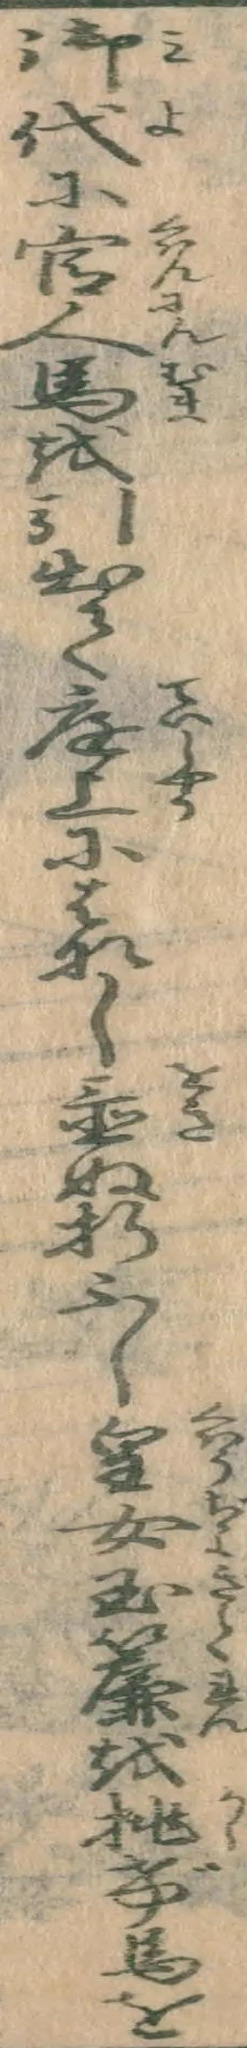御代に官人馬を引出て庭上にはなし置ぬ折ふし皇女玉簾を挑げ馬を
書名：養蚕秘録 3巻. [3]
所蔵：国立国会図書館 National Diet Library, JAPAN
